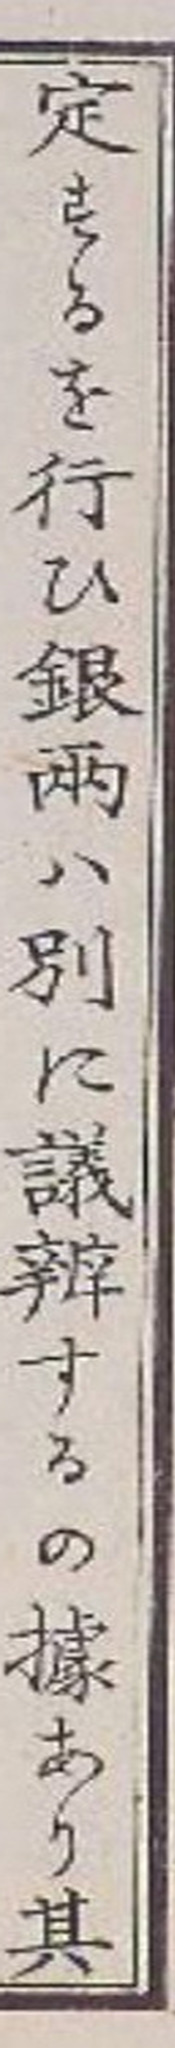定するを行ひ銀両は別に議弁するの拠あり其
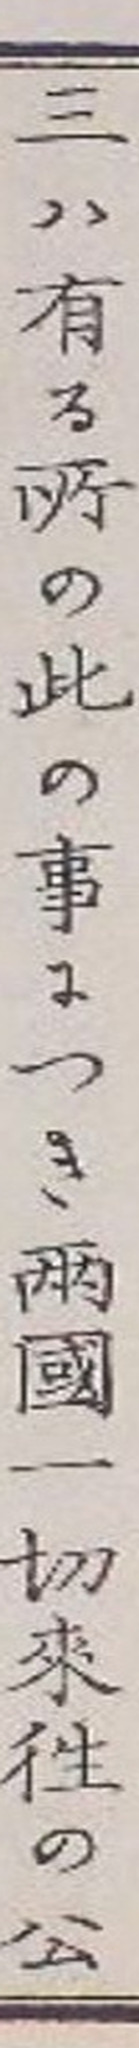三は有る所の此の事につき両国一切来往の公
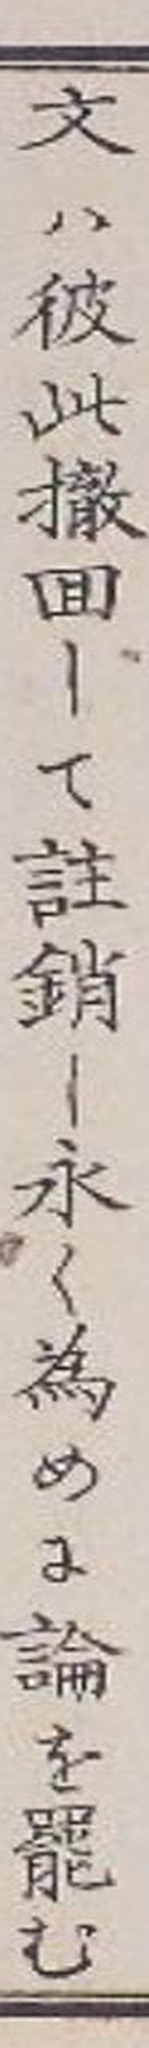文は彼此撤回して註鎖し永く為めに論を罷む
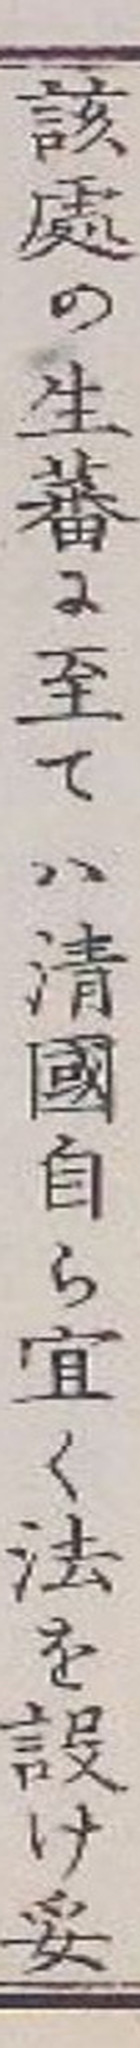該処の生蕃に至ては清国自ら宣く法を設け妥
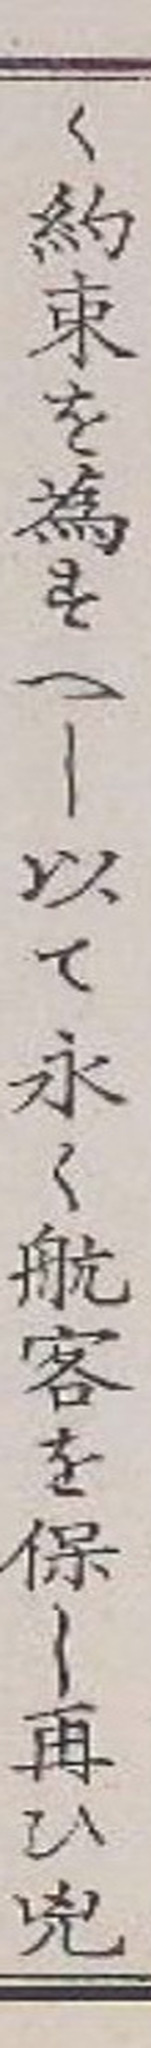く約束を為すへし以て永く航客を保し再ひ兇
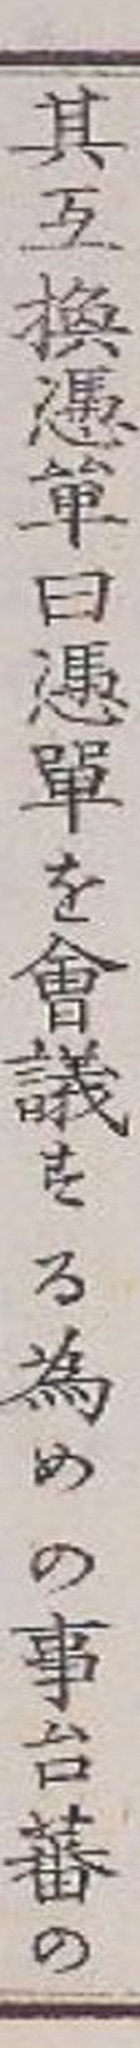其互換憑単曰憑単を会議する為めの事台蕃の
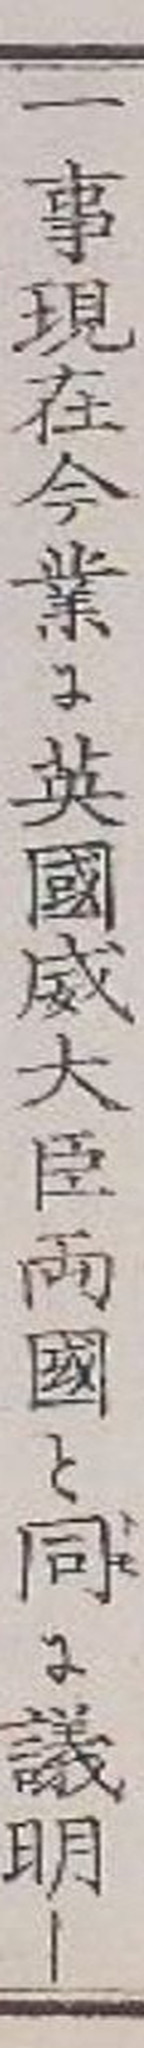一事現在今業に英国威大臣両国と同に議明し
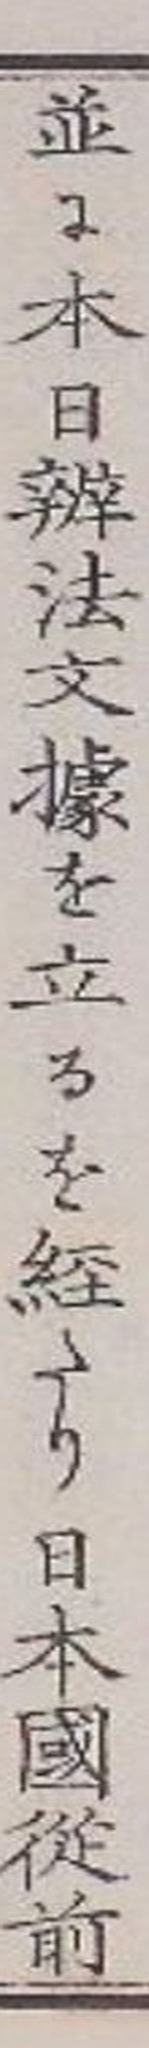並に本日弁法文拠を立るを経たり日本国従前
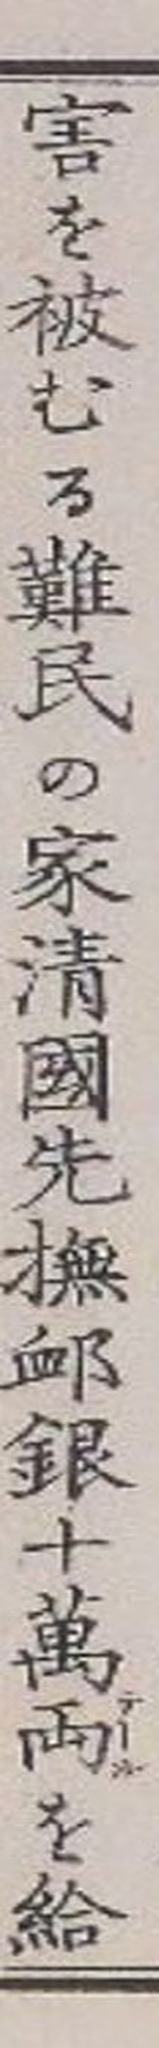害を被むる難民の家清国先撫卹銀十万両を給

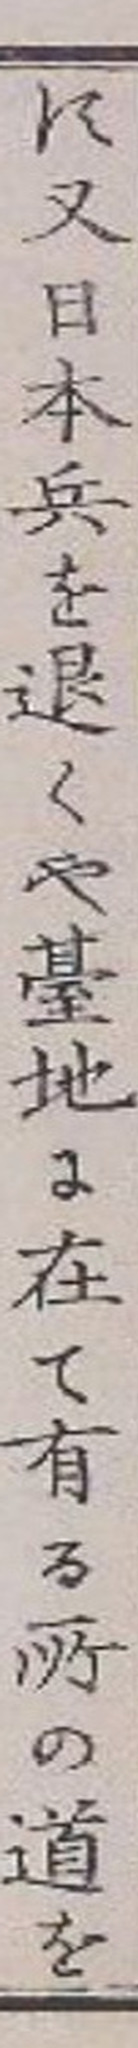す又日本兵を退くや台地に在て有る所の道を
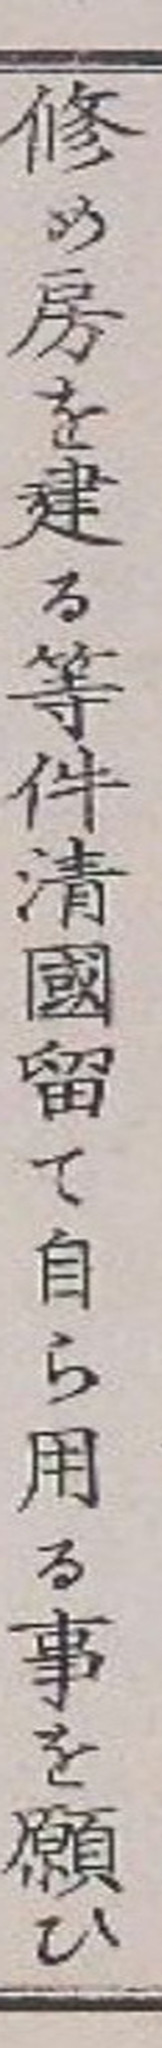修め房を建る等件清国留て自ら用る事を願ひ
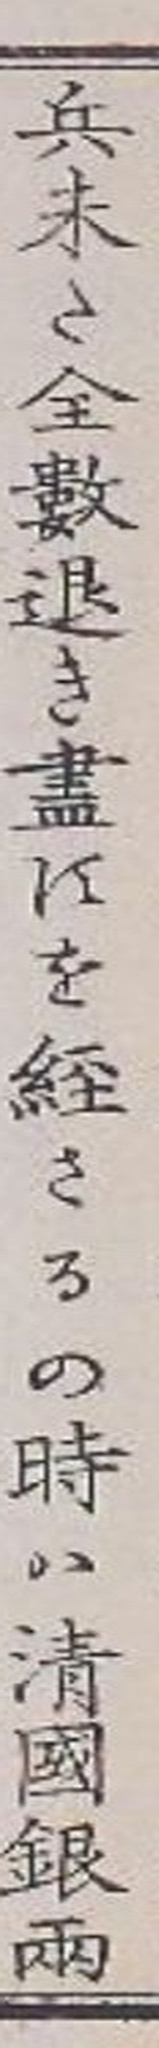兵未た全数退き尽すを経さるの時は清国銀両
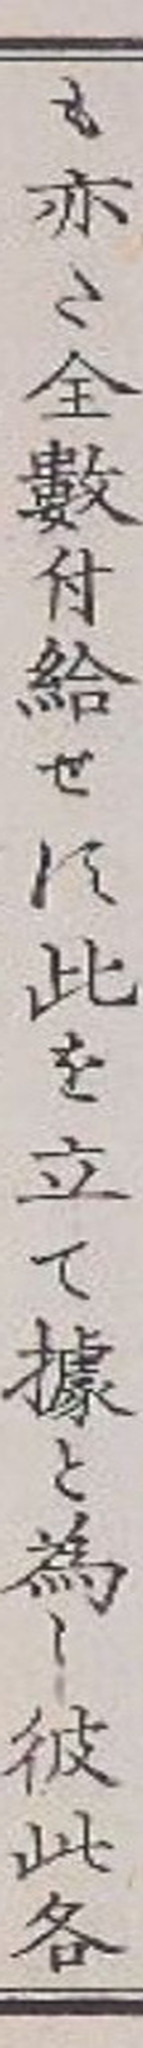も亦た全数付給せす此を立て據と為し彼此各
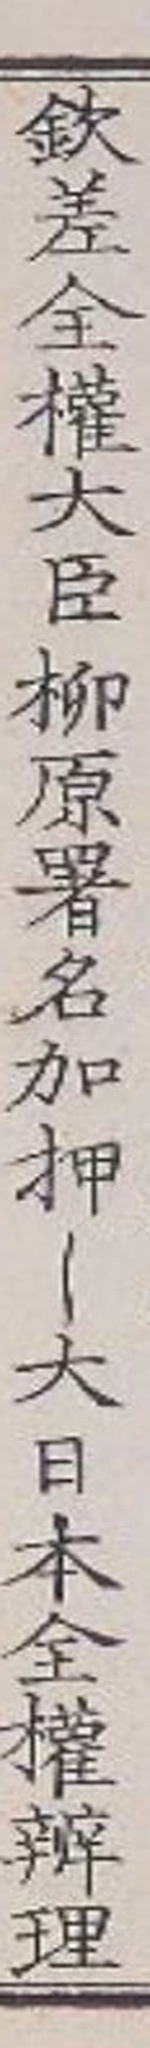欽差全権大使柳原署名加押し大日本全権弁理
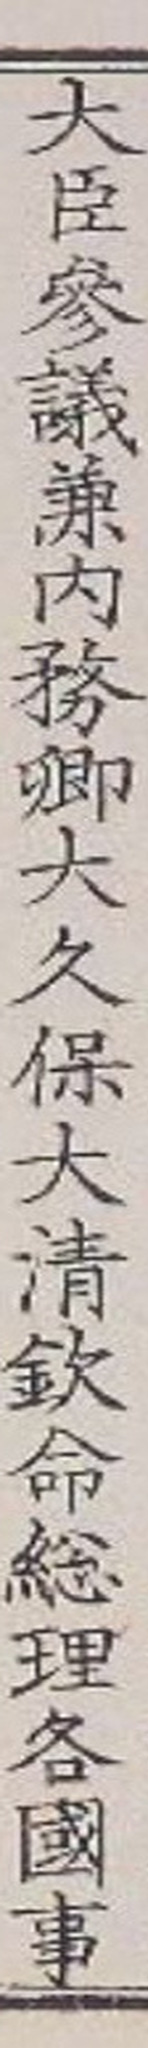大臣参議兼内務卿大久保大清欽命総理各国事
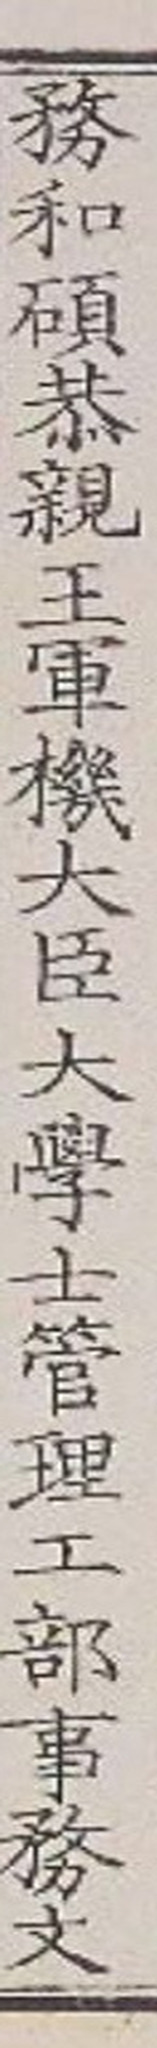務和碩恭親王軍機大臣大学士管理工部事務文
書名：南島紀事 下
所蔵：University of the Ryukyus Library
